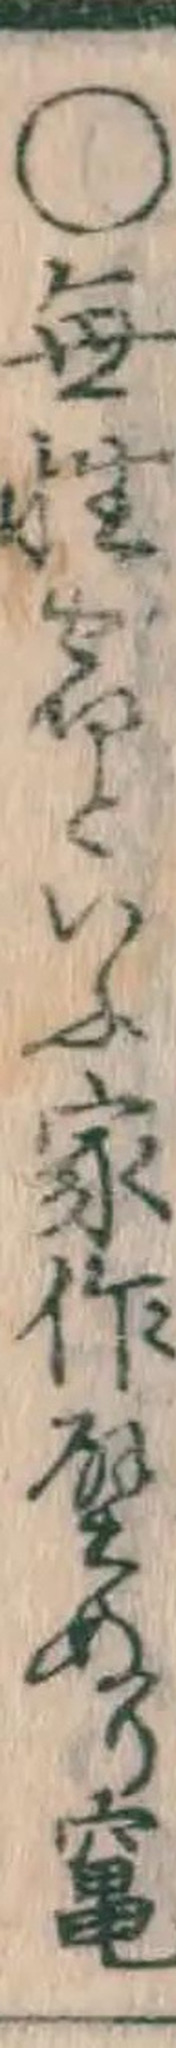○無性宿といふ家作壁ぬり竈
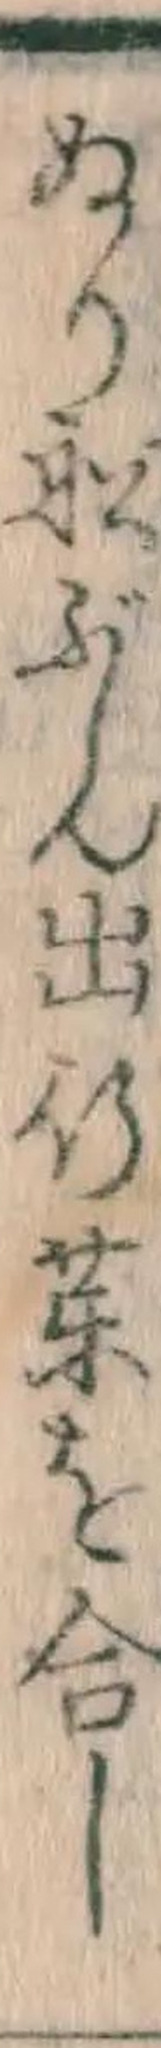ぬり船ぶしん出行薬を合し
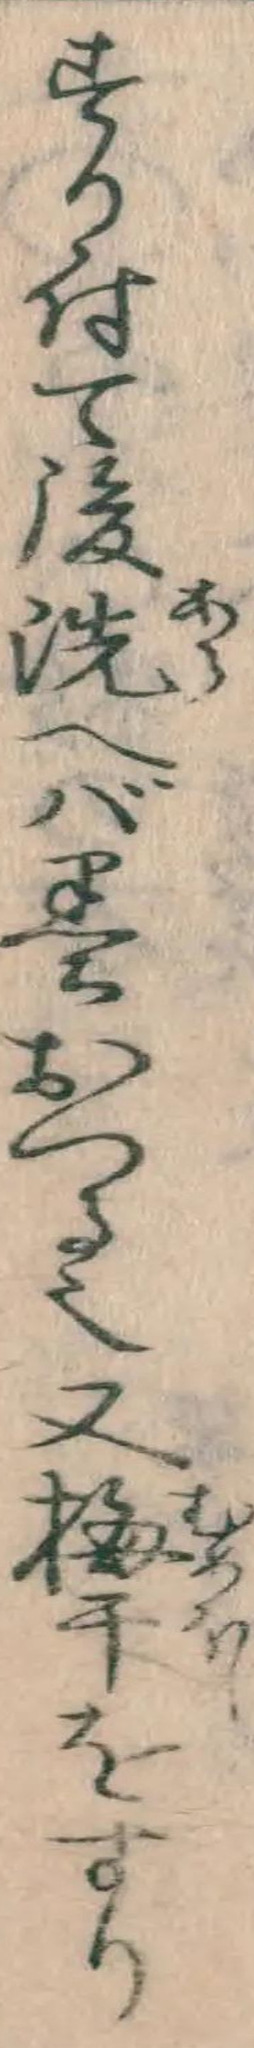すり付て後洗へば墨おつる也又梅干をすり
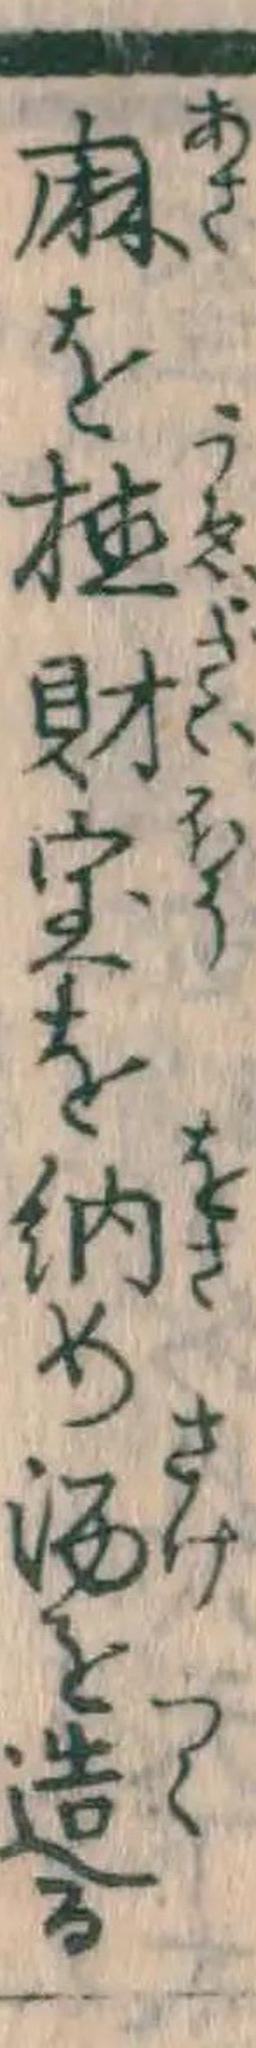麻を植財宝を納め酒を造る
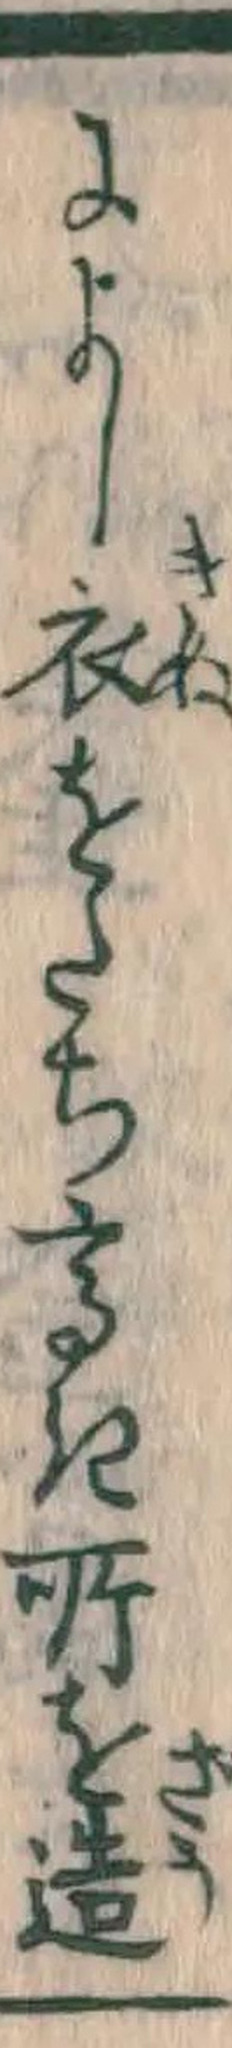によし衣をたち高き所を造
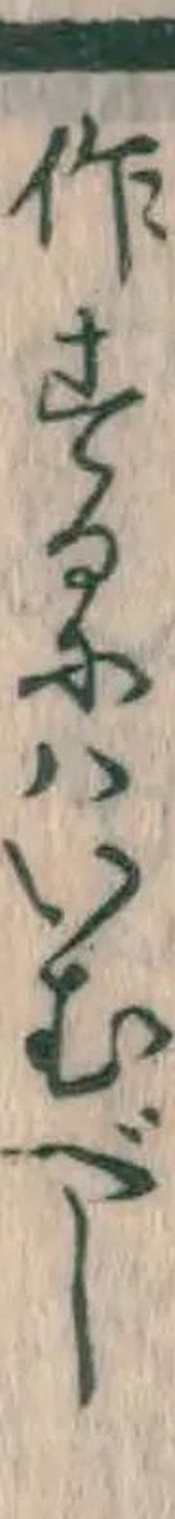作するにはいむべし
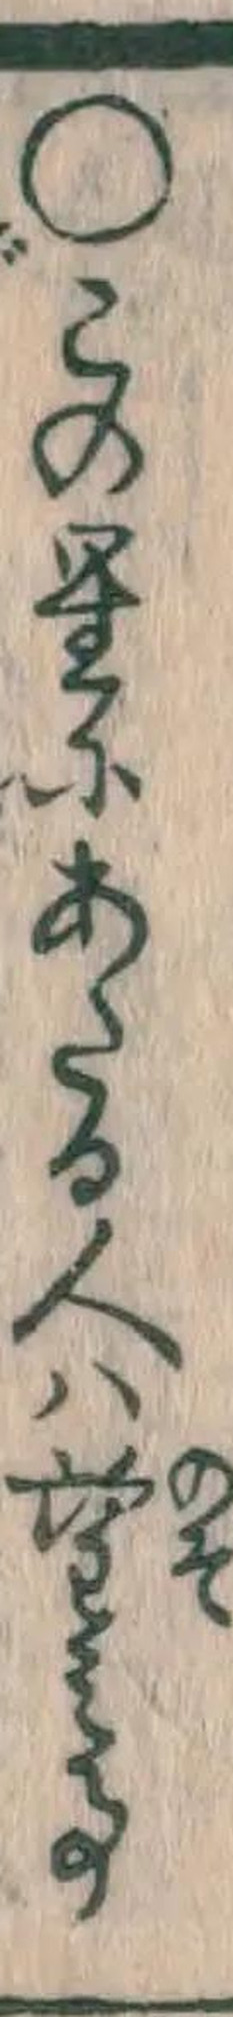○この星にあたる人は望み事
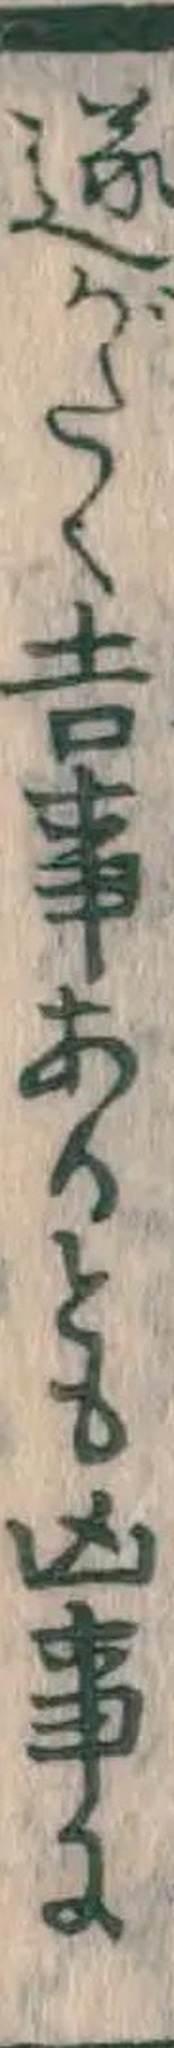遂がたく吉事ありとも凶事に
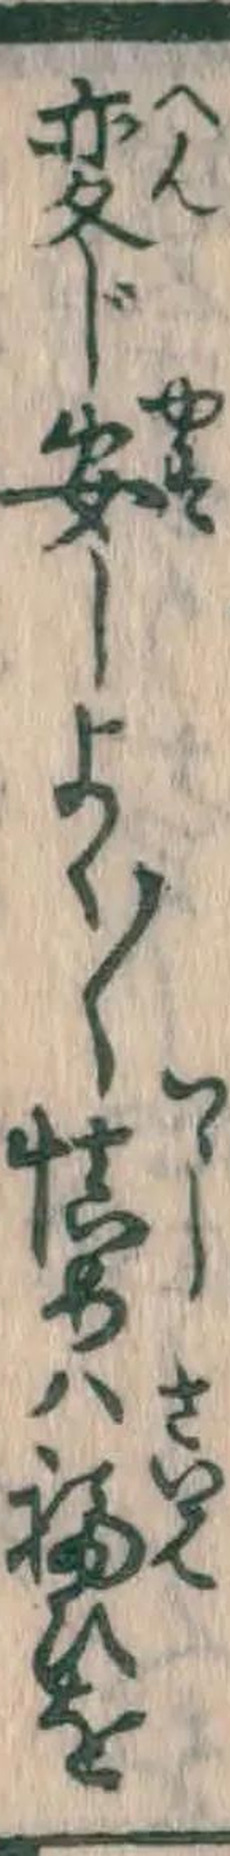変じ安しよく〳〵慎めは福ひを
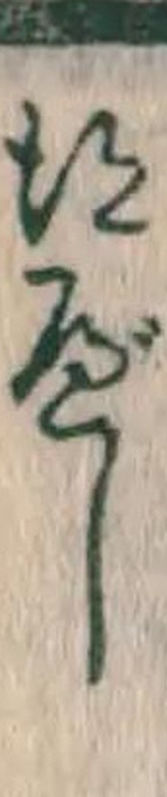得べし
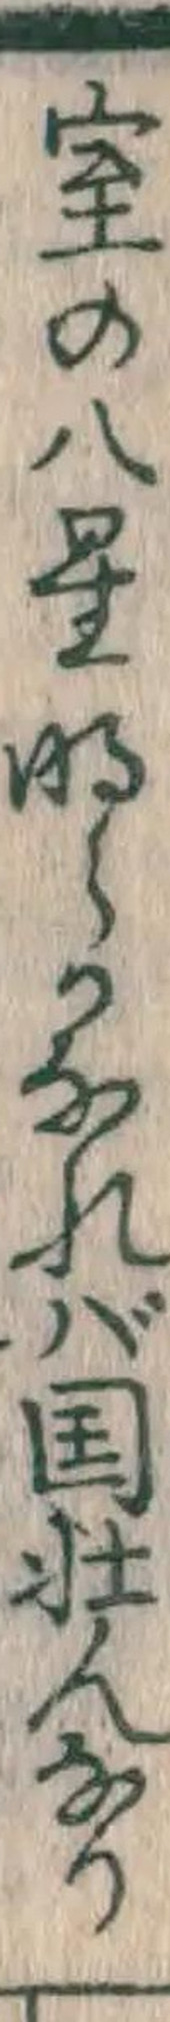室の八星明らかなれば国壮んなり
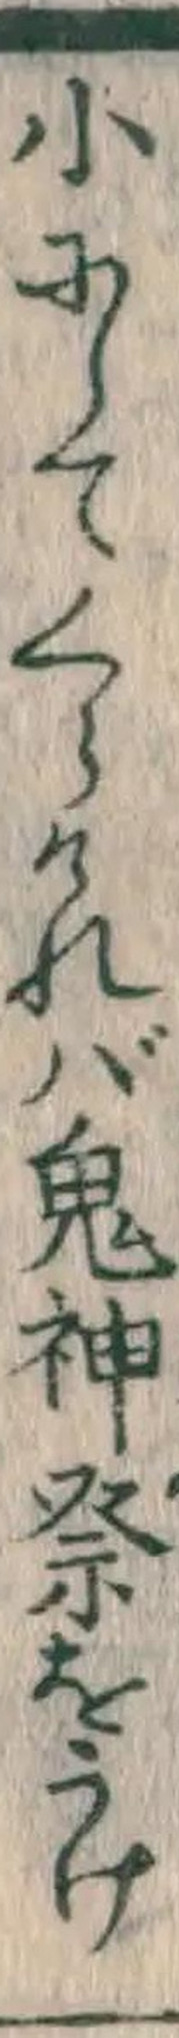小にしてくらければ鬼神祭をうけ
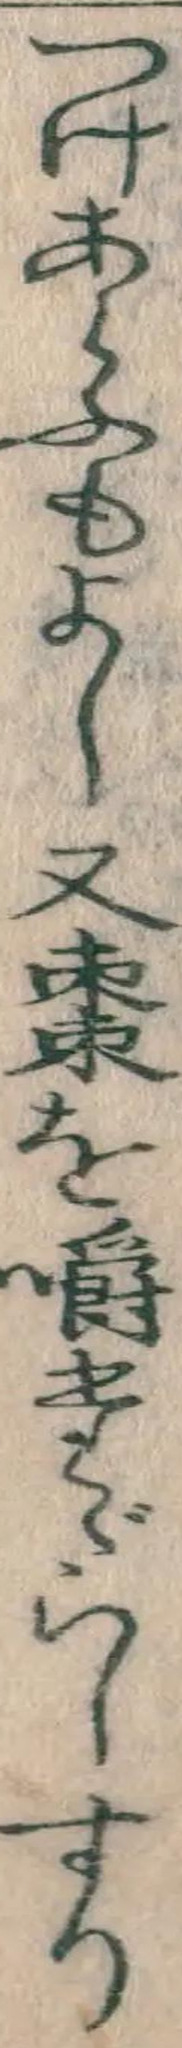つけあらふもよし又棗を嚼たゞらしすり
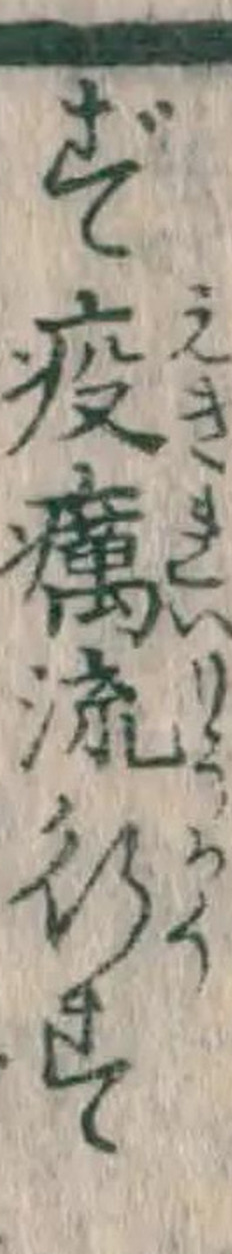ず疫癘流行す
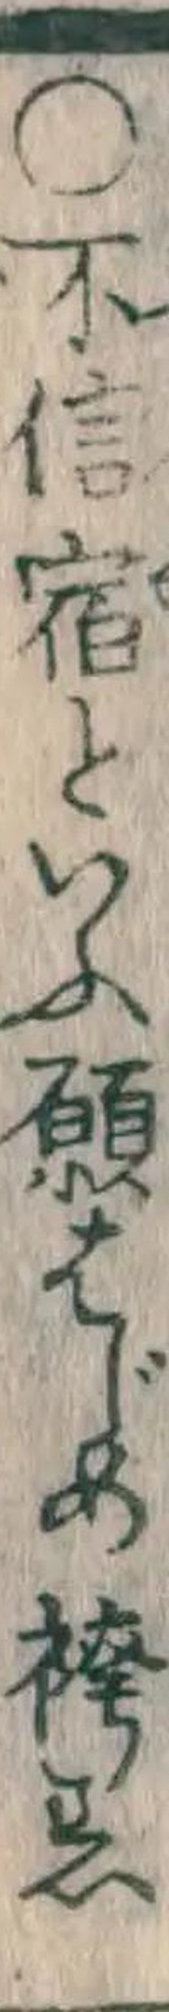○不信宿といふ願はじめ袴着
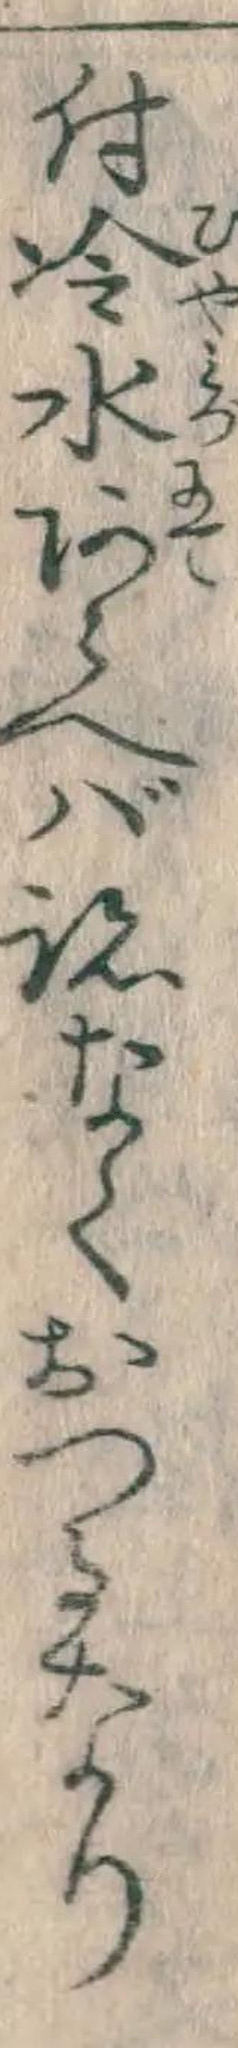付冷水にてあらへば跡なくおつるなり
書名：広益秘事大全 3巻. [2]
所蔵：国立国会図書館 National Diet Library, JAPAN
